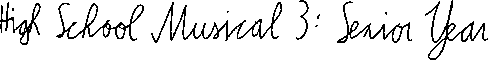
High School Musical 3: Senior Year
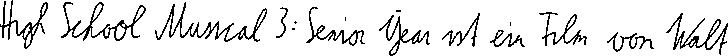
High School Musical 3: Senior Year ist ein Film von Walt
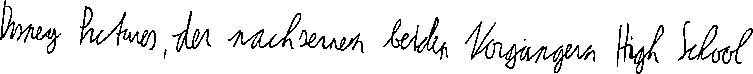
Disney Pictures, der nach seinen beiden Vorgängern High School
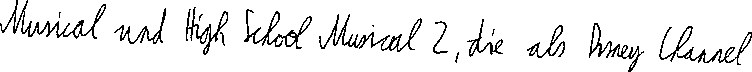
Musical und High School Musical 2, die als Disney Channel
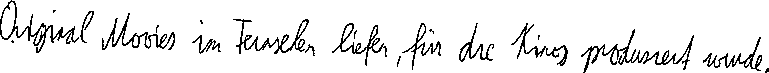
Original Movies im Fernsehen liefen, für die Kinos produziert wurde.
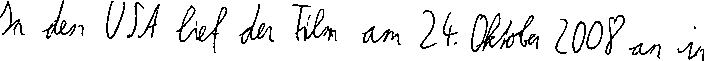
In den USA lief der Film am 24. Oktober 2008 an, in
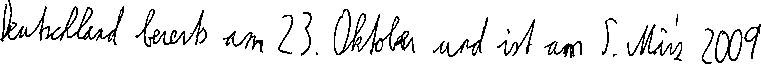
Deutschland bereits am 23. Oktober und ist am 5. März 2009
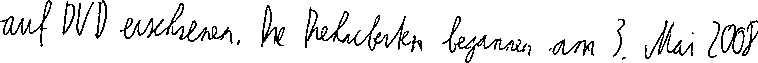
auf DVD erschienen. Die Dreharbeiten begannen am 3. Mai 2008
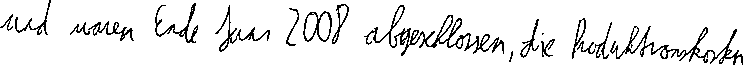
und waren Ende Juni 2008 abgeschlossen, die Produktionskosten
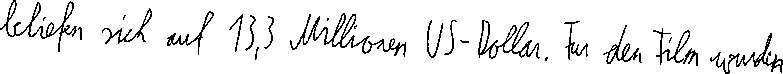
beliefen sich auf 13,3 Millionen US-Dollar. Für den Film wurden
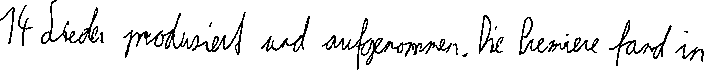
14 Lieder produziert und aufgenommen. Die Premiere fand in
